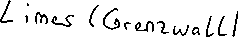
Limes (Grenzwall)
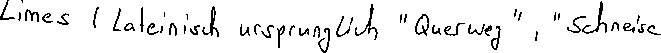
Limes (lateinisch ursprünglich "Querweg", "Schneise
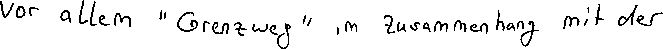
vor allem "Grenzweg" im Zusammenhang mit der
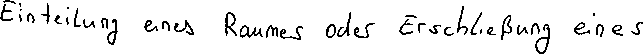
Einteilung eines Raumes oder der Erschließung eines
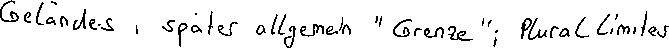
Geländes, später allgemein "Grenze"; Plural limites
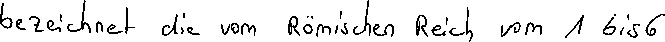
bezeichnet die vom Römischen Reich vom 1. bis 6
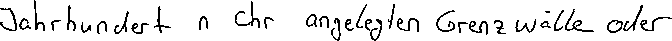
Jahrhundert n. Chr. angelegten Grenzwälle oder
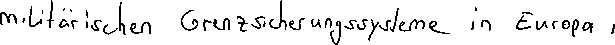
militärischen Grenzsicherungssysteme in Europa,
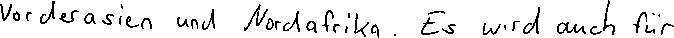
Vorderasien und Nordafrika. Es wird auch für
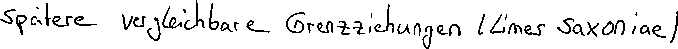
spätere vergleichbare Grenzziehungen (Limes Saxoniae)
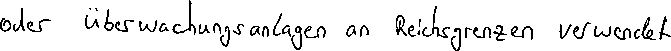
oder Überwachungsanlagen an Reichsgrenzen verwendet
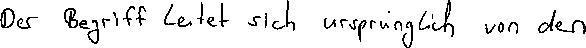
Der Begriff leitet sich ursprünglich von den
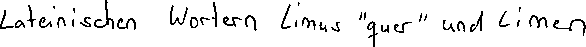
lateinischen Wörtern limus "quer" und limen
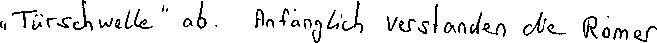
"Türschwelle" ab. Anfänglich verstanden die Römer
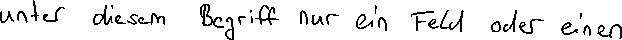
unter diesem Begriff nur ein Feld oder einen
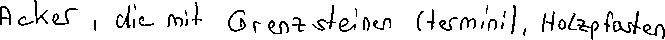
Acker, die mit Grenzsteinen (termini), Holzpfosten
